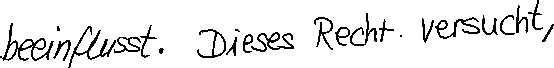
beeinflusst. Dieses Recht versucht,
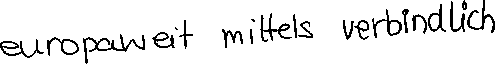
europaweit mittels verbindlich
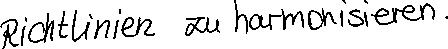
Richtlinien zu harmonisieren.
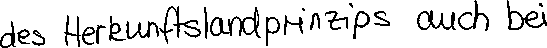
des Herkunftslandprinzips auch bei
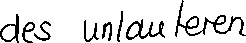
des unlauteren
